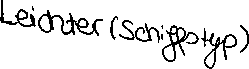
Leichter (Schiffstyp)
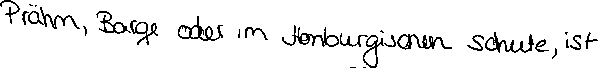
Prähm, Barge oder im Hamburgischen Schute, ist
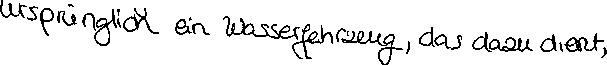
ursprünglich ein Wasserfahrzeug, das dazu dient,
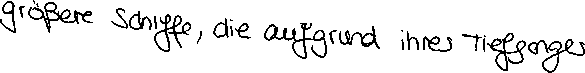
rößere Schiffe, die aufgrund ihres Tiefganges
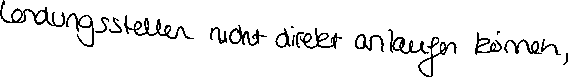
Landungsstellen nicht direkt anlaufen können,
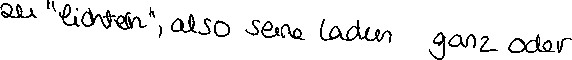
zu "lichtern", also seine Ladung ganz oder
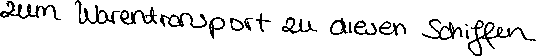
zum Warentransport zu diesen Schiffen
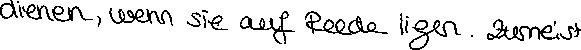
dienen, wenn sie auf Reede liegen. Zumeist
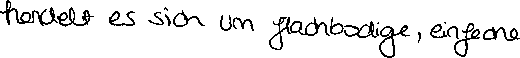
handelt es sich um flachbodige, einfache
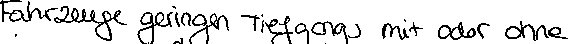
Fahrzeuge geringen Tiefgangs mit oder ohne
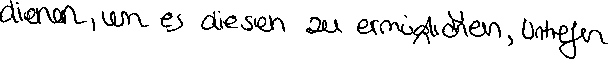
dienen, um es diesen zu ermöglichen, Untiefen
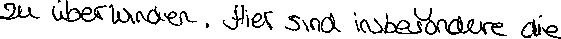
zu überwinden. Hier sind insbesondere die
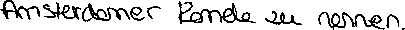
Amsterdamer Kamele zu nennen.
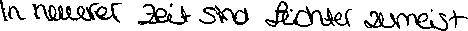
In neuerer Zeit sind Leichter zumeist
